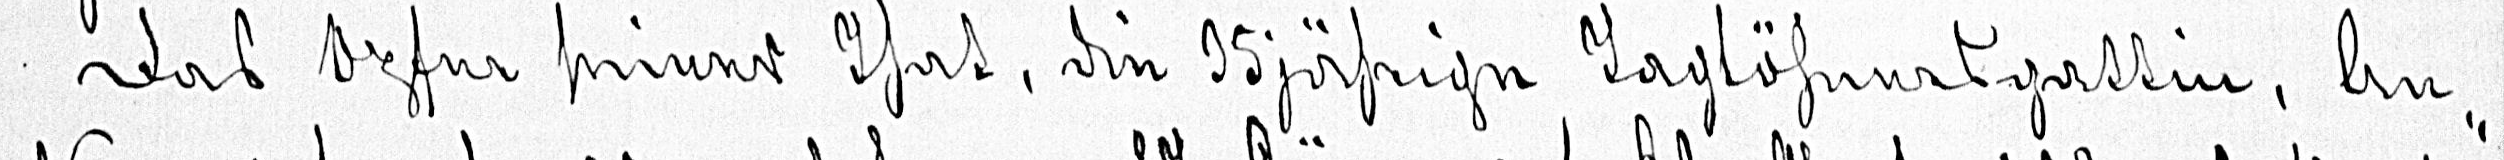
Das Opfer seiner That, die 35jährige Taglöhnersgattin, An¬
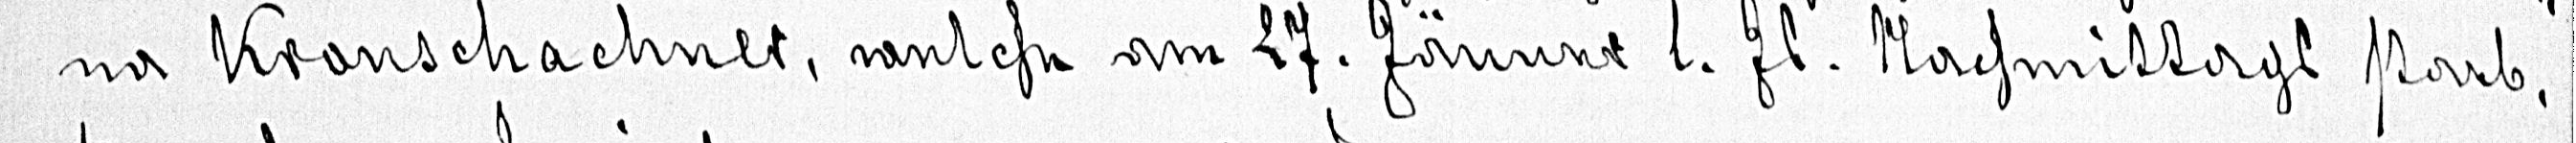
na Kronschachner, welche am 27. Jänner 1. Js. Nachmittags starb,
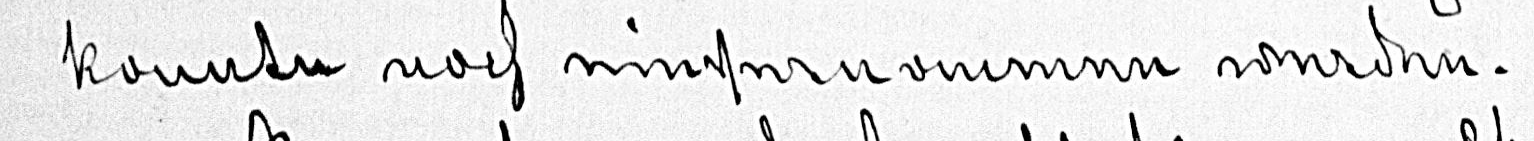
konnte noch einvernommen werden.
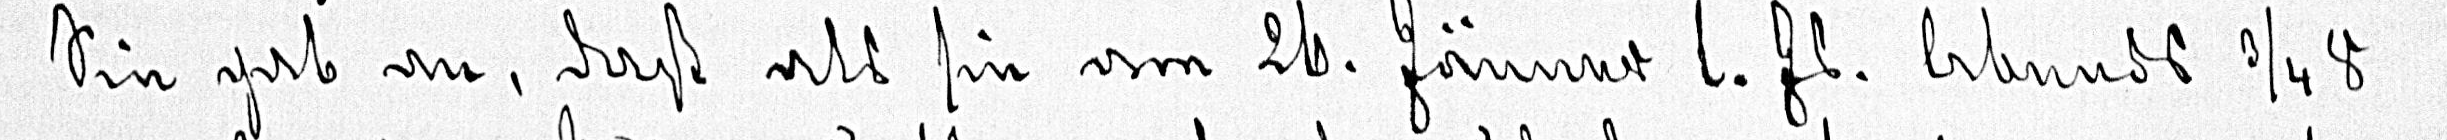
Sie gab an, daß als sie am 26. Jänner 1. Js. Abends 3/4 8
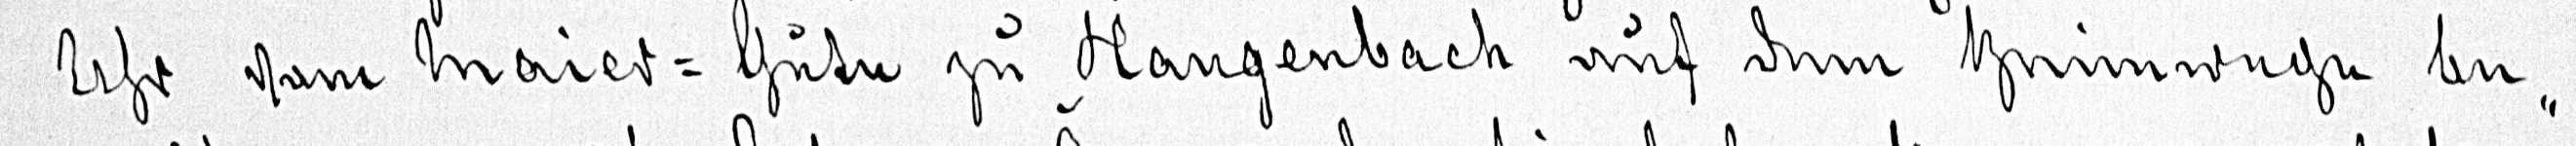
Uhr vom Maier - Gute zu Hangenbach auf dem Heimwege be¬
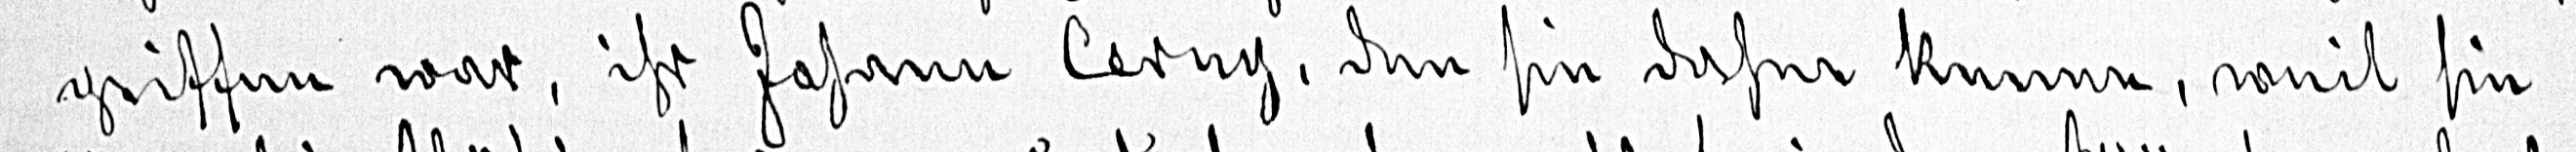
griffen war, ihr Johann Černy, den sie daher kenne, weil sie
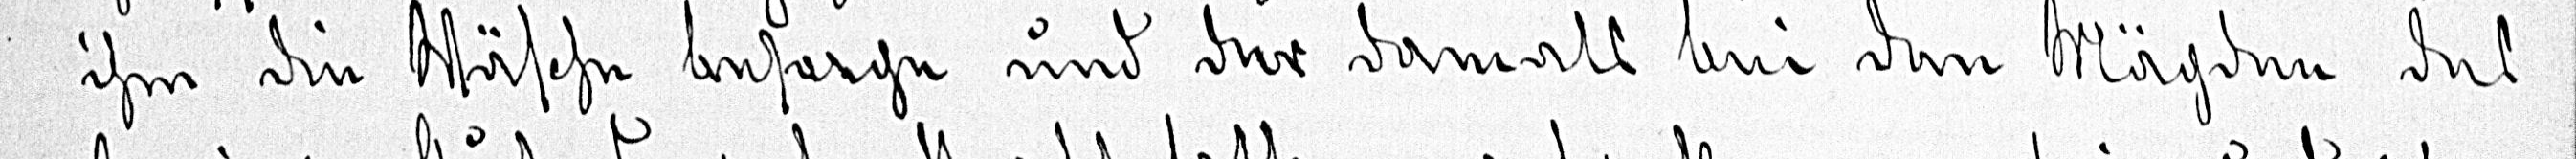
ihm die Wäsche besorge und der damals bei den Mägden des
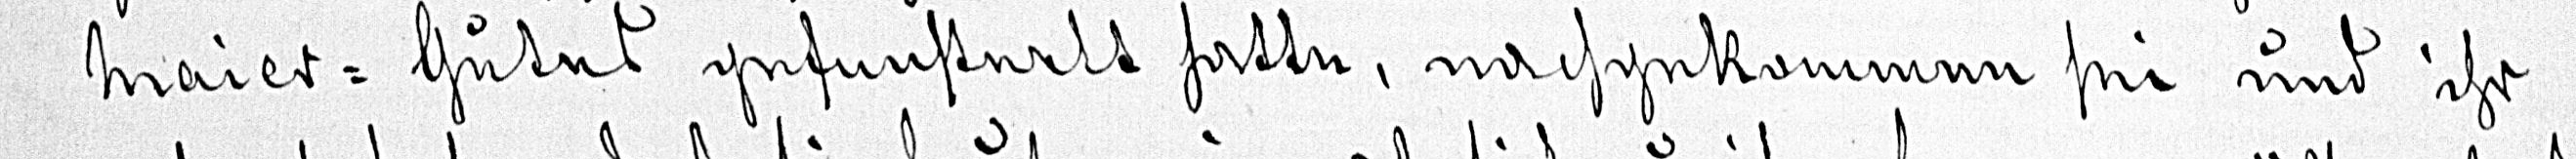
Maier - Gutes gefensterlt hatte, nachgekommen sei und ihr
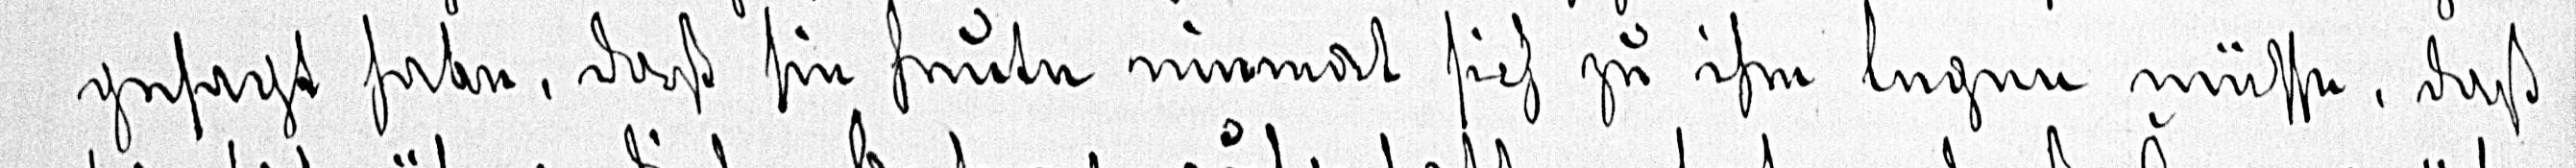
gesagt habe, daß sie heute einmal sich zu ihm legen müsse, daß
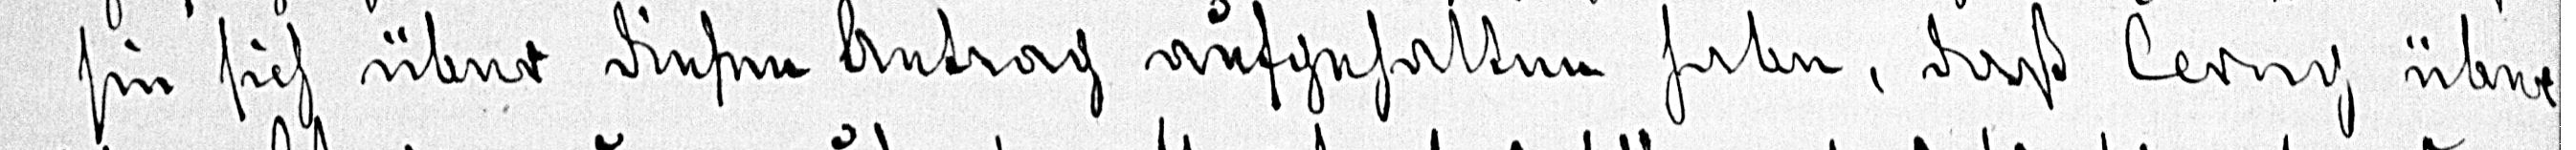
sie sich über diesen Antrag aufgehalten habe, daß Černy über
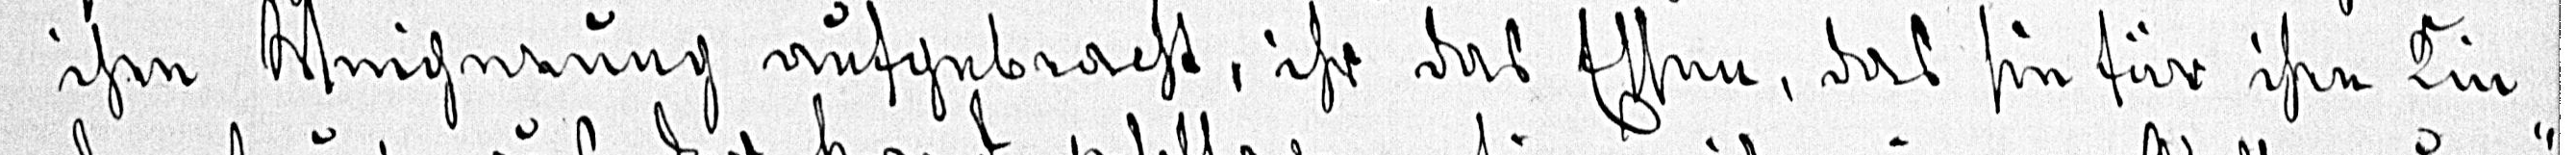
ihre Weigerung aufgebracht, ihr das Essen, das sie für ihre Kin¬
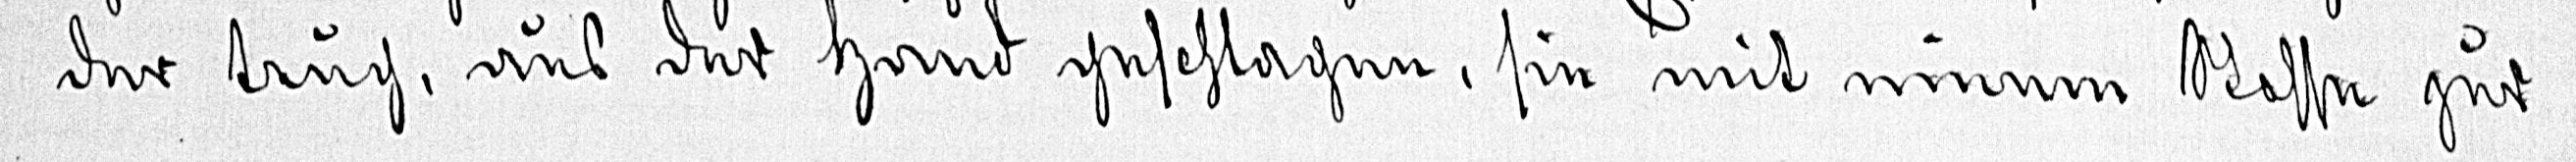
der trug, aus der Hand geschlagen, sie mit einem Stoxxe zur
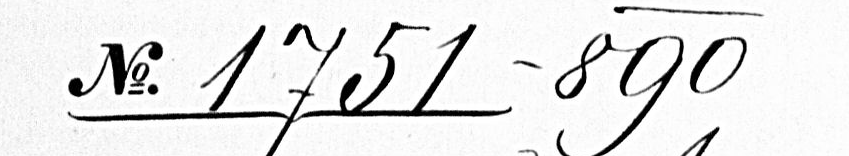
N° 1751 - 890
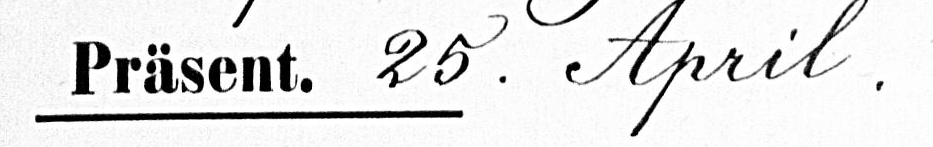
Präsent. 25. April.
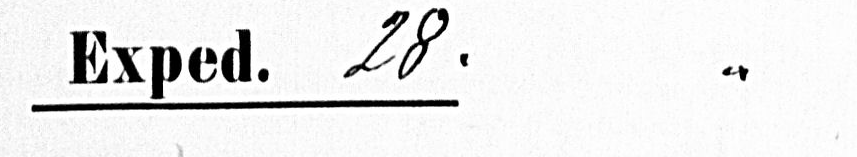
Exped. 28. April.
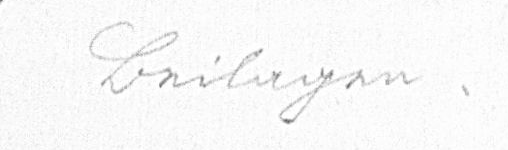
Beilagen.
